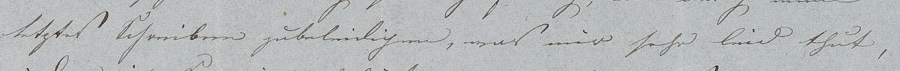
letztes Schreiben zubeleidigen, was mir sehr leid thut,
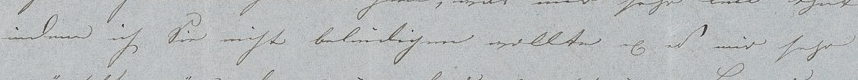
indem ich Sie nicht beleidigen wollte & es mir sehr
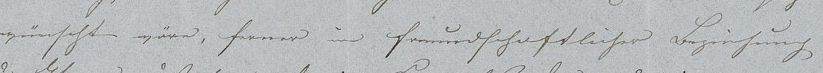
erwünscht wäre, ferner in freundschaftlicher Beziehung
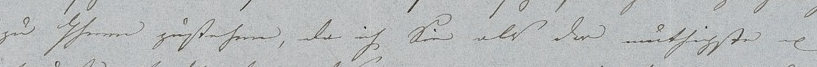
zu Ihnen zustehen, da ich Sie als der muthigste &
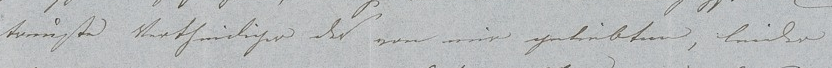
treuste Vertheidiger des von mir geliebten, leider
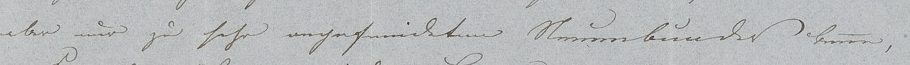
aber nur zu sehr angefeindeten Neuenbundes kenne,
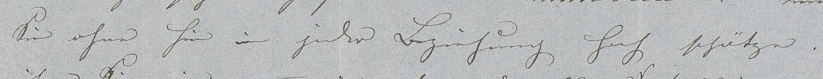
Sie ohne hin in jeder Beziehung hoch schätze.
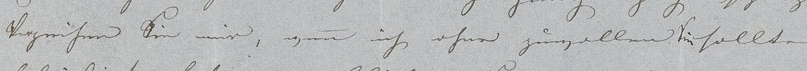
Verzeihen Sie mir, wenn ich ohne zuwollen Sie sollte
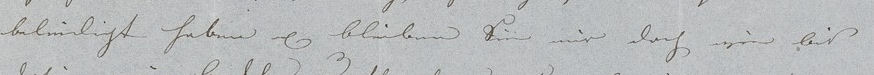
beleidigt haben & bleiben Sie mir doch wie bis
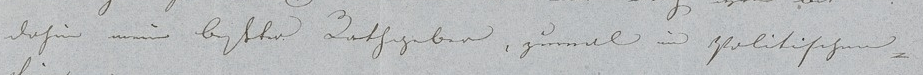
dahin mein bester Rathgeber, zumal in Politischen-
